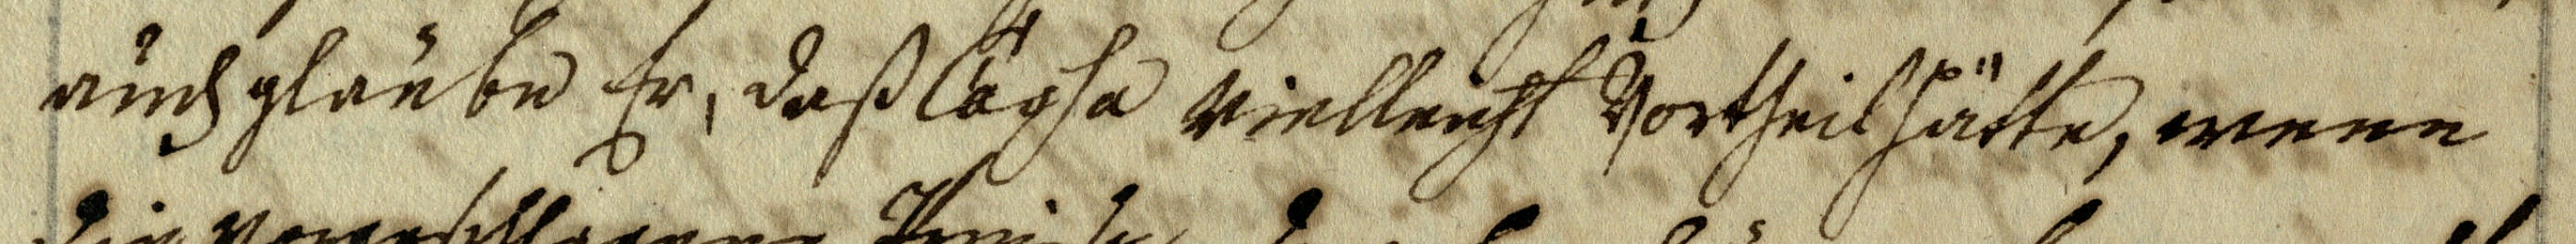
auch glaube Er, daß Cassa vielleicht Vortheil hätte, wenn
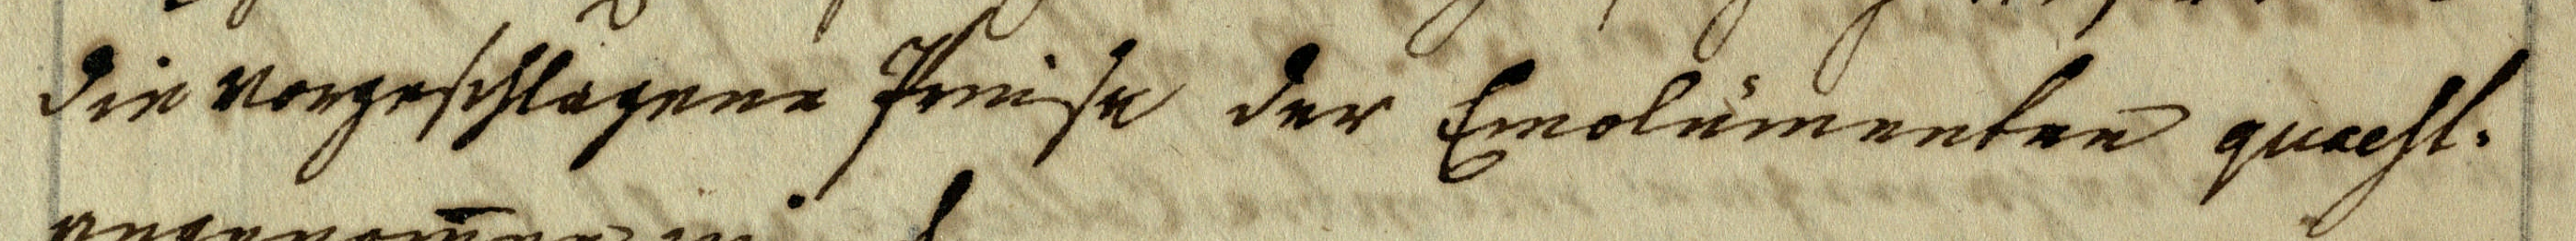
die vorgeschlagene Preise der Emolumenten quaest.
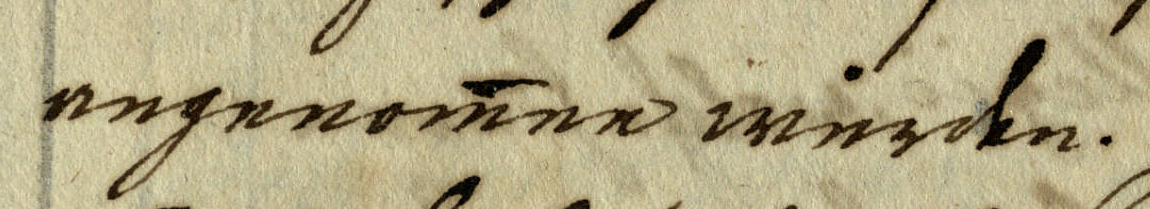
angenomen wurden.
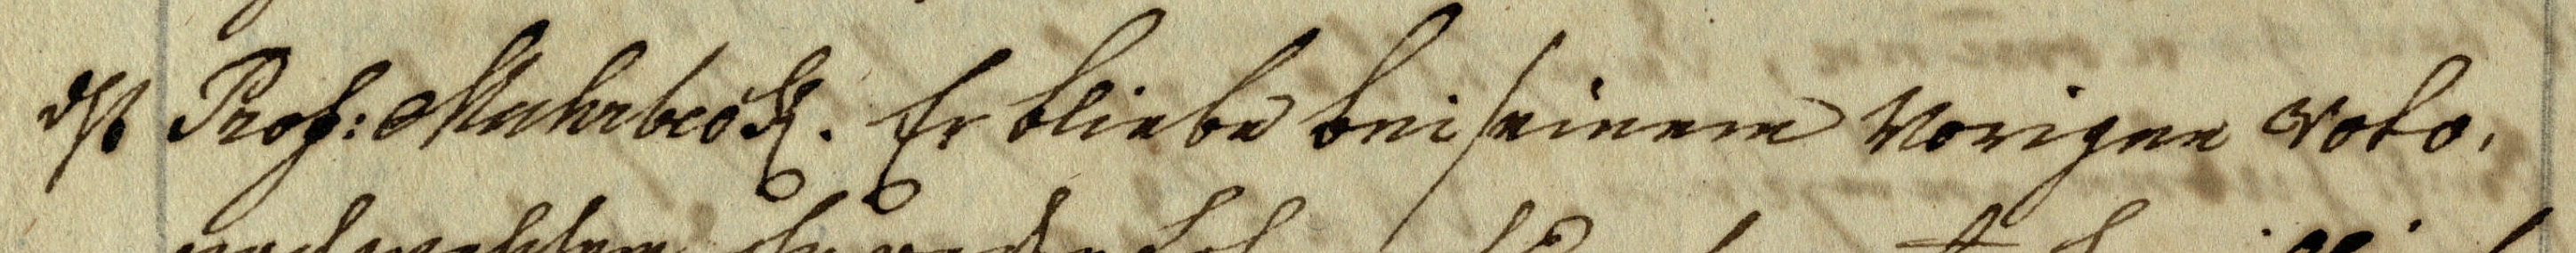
dh. Prof. Muhrbeck. Er bliebe bei seinem vorigen voto,
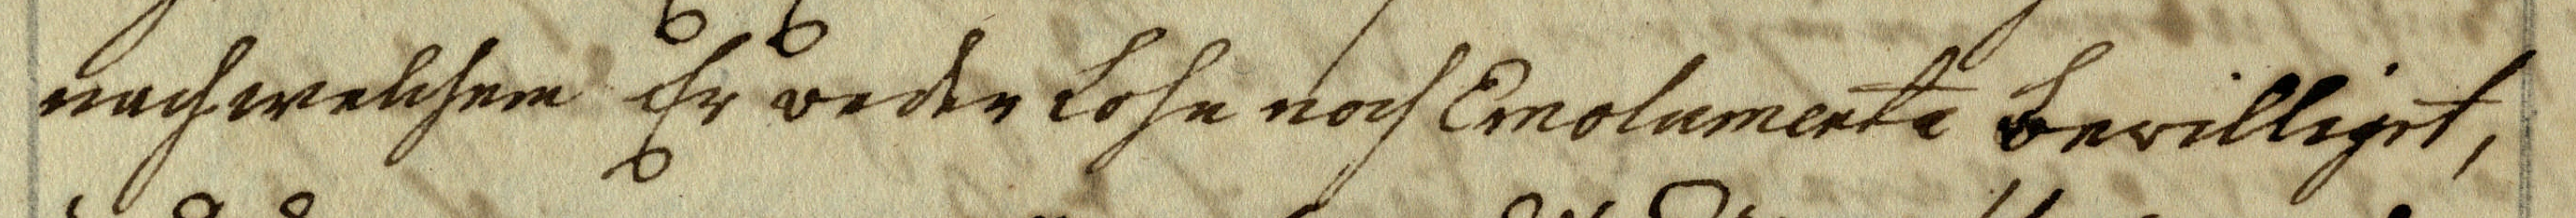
nach welchem Er weder Lohn noch Emolumente bewilliget,
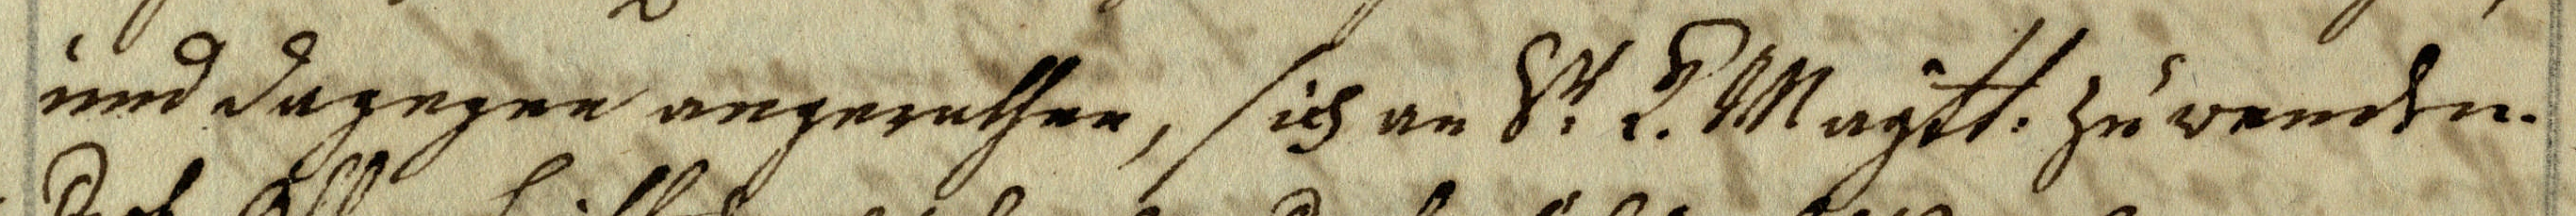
und dagegen angerathen, sich an Sr. K. Maÿtt. zu wenden.
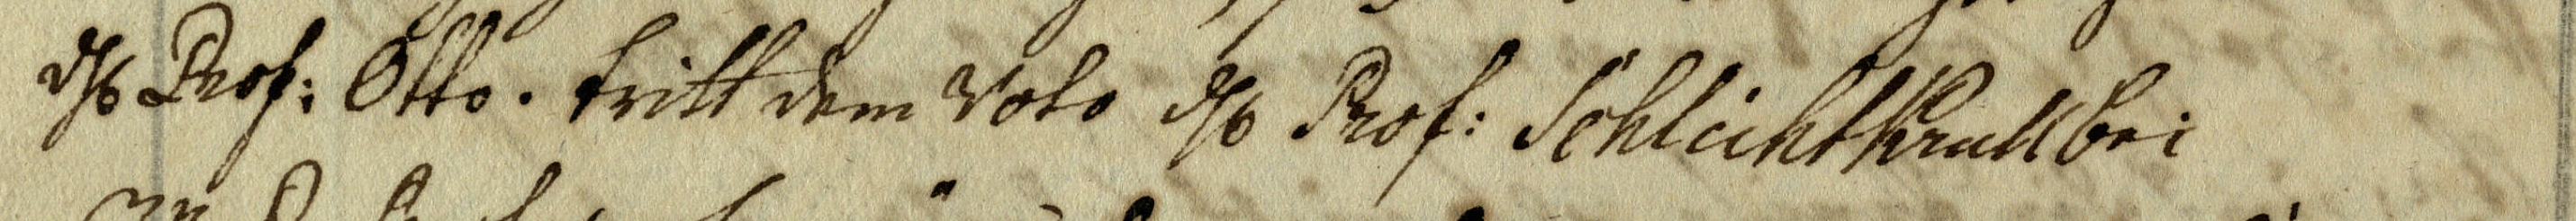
dh Prof. Otto. tritt dem Voto dh Prof. Schlichtkrull bei.
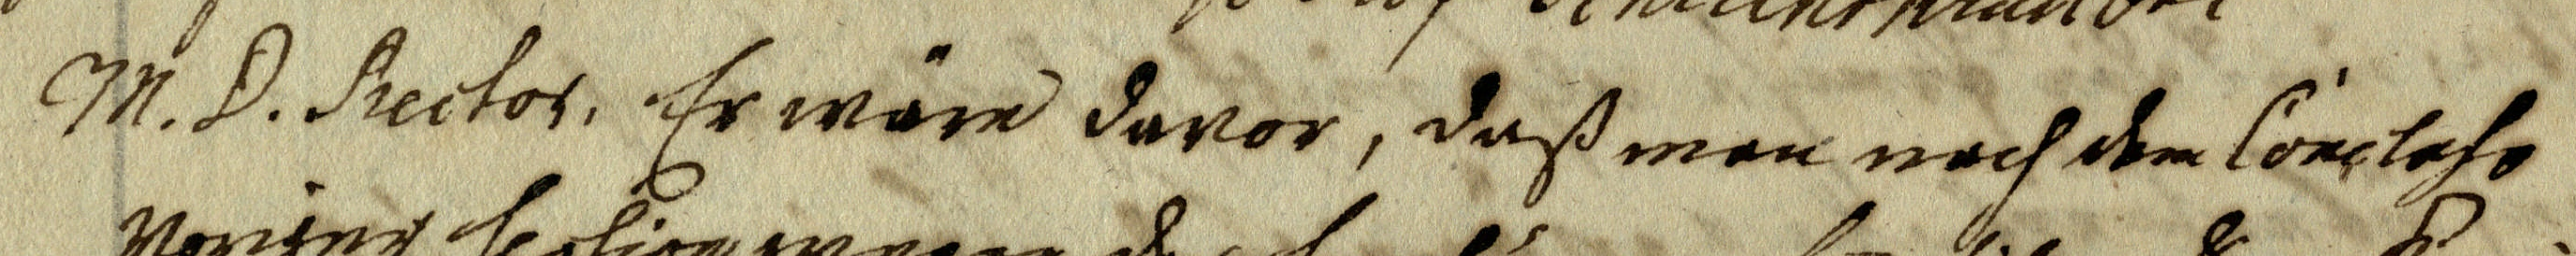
M. D. Rector. Er wäre davor, daß man nach dem Concluso
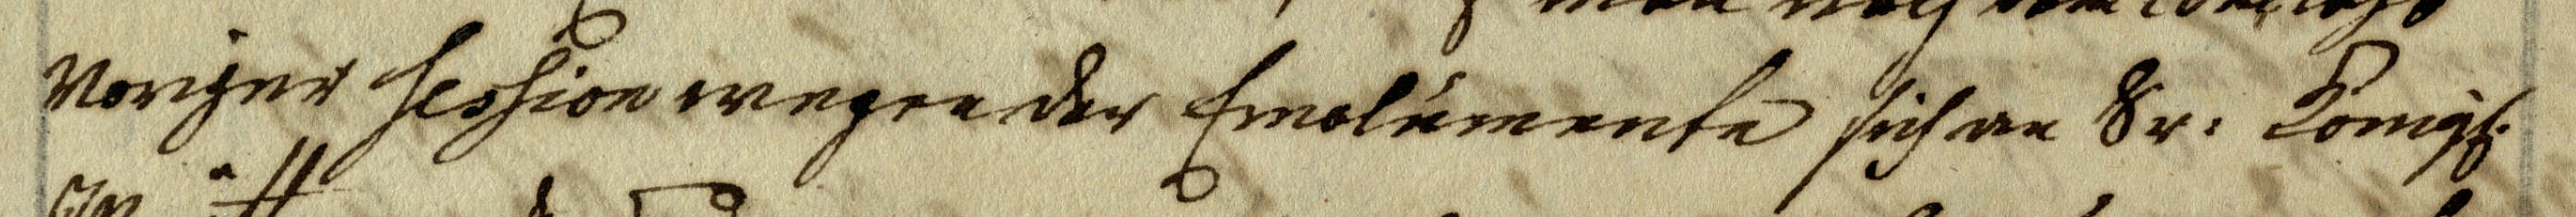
voriger Session wegen der Emolumente sich an Sr. Königl.
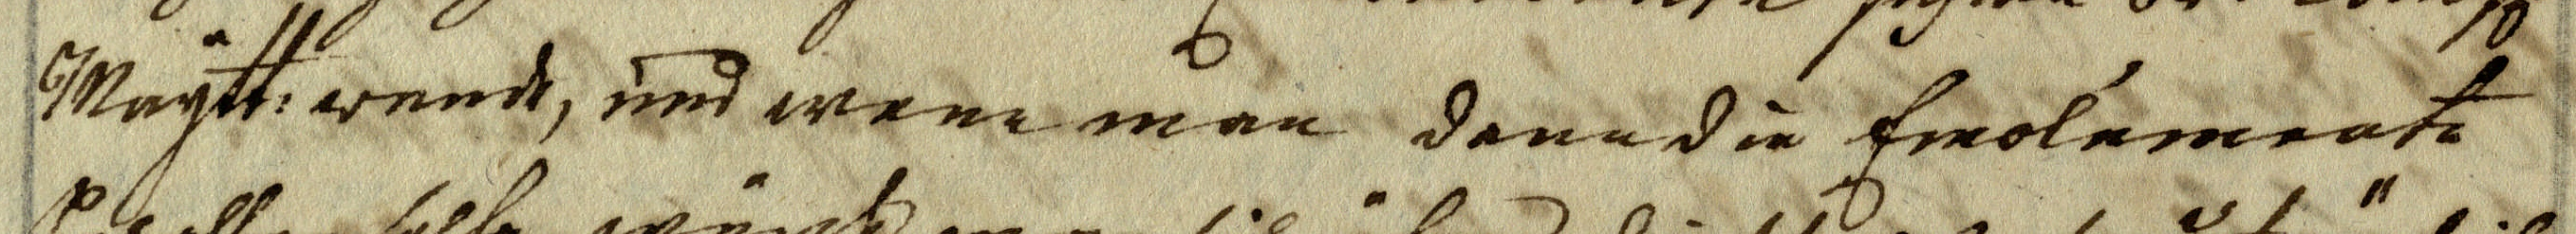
Maÿtt. wende, und wenn man dann die Emolumente
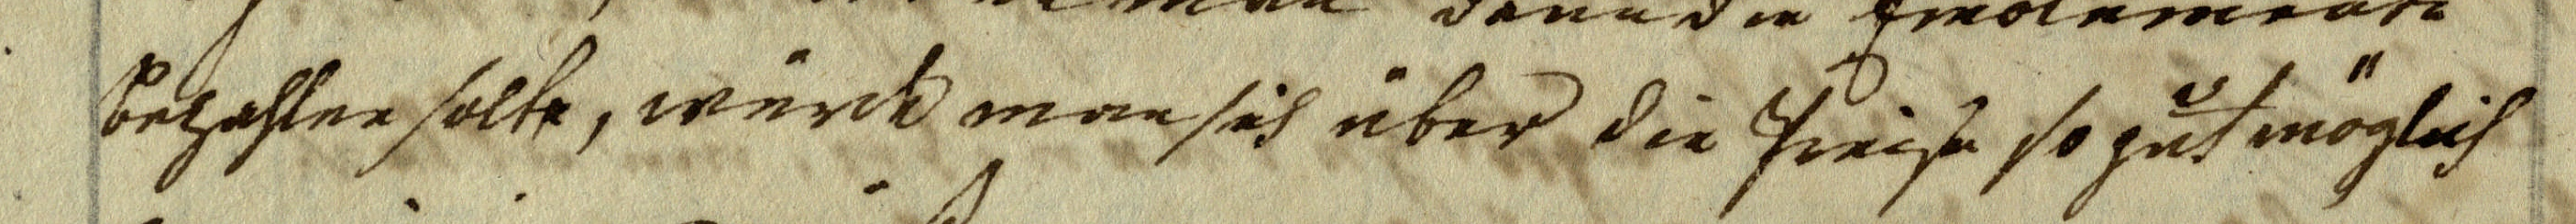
bezahlen solte, würde man sich über die Preise so gut möglich
